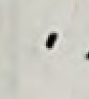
,
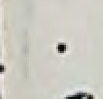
,
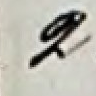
2
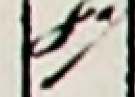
87
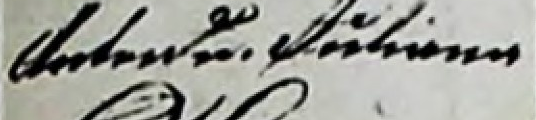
Anton u. Juliana
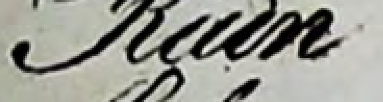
Kain
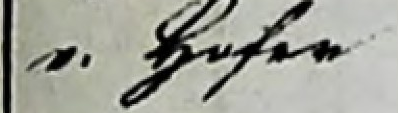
v. Hofer
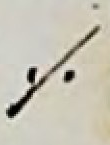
./.
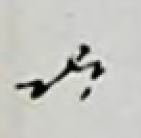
do
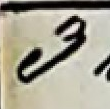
3
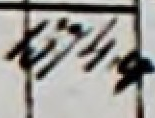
4,74
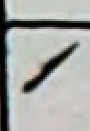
1
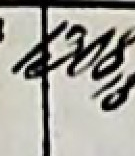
1308,8
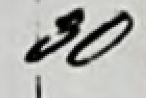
30
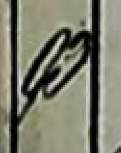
93
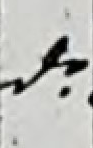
do
